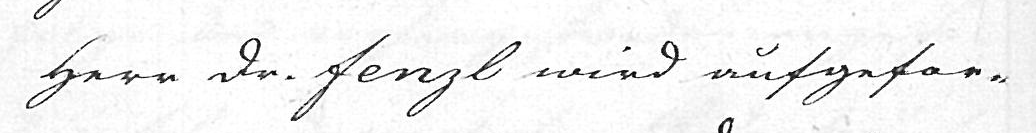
Herr Dr. Fenzl wird aufgefor-
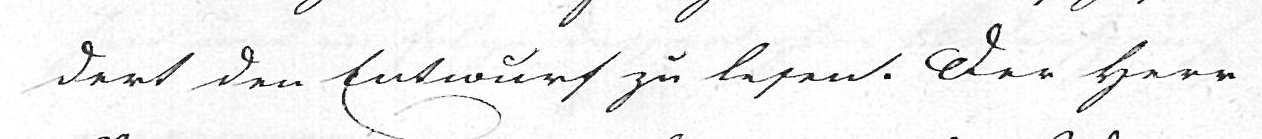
dert den Entwurf zu lesen. Der Herr
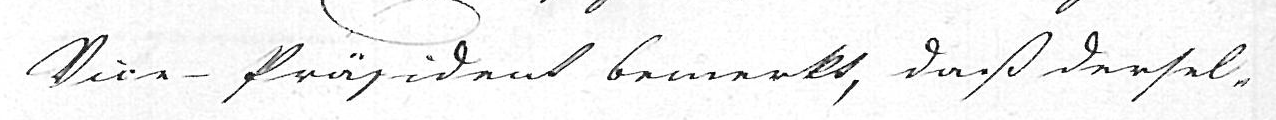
Vice-Präsident bemerkt, daß dersel-
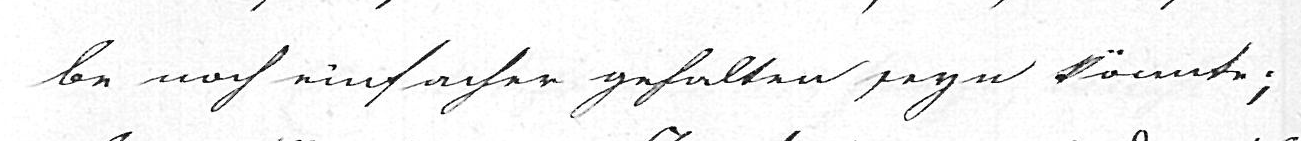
be noch einfacher gehalten seyn könnte;
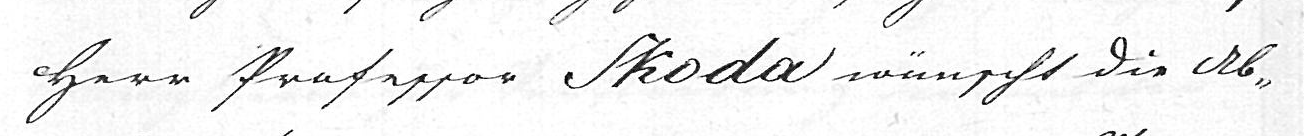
Herr Professor Skoda wünscht die Ab-
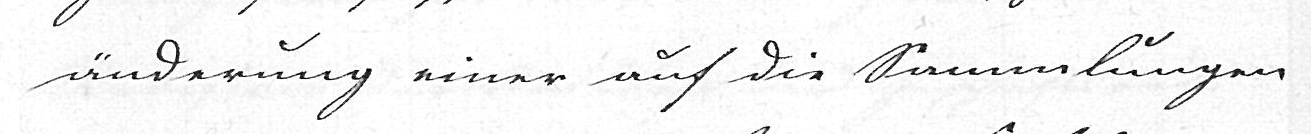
änderung einer auf die Sammlungen
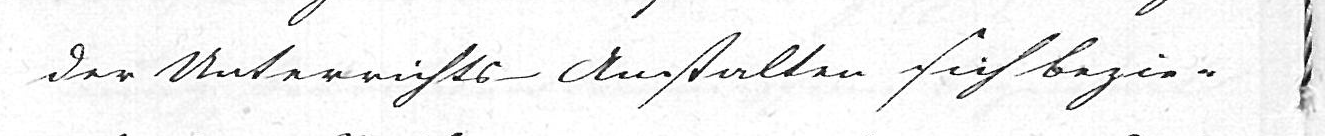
der Unterrichts-Anstalten sich bezie-
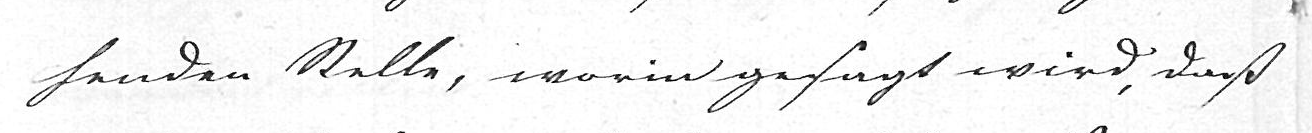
henden Stelle, worin gesagt wird, daß
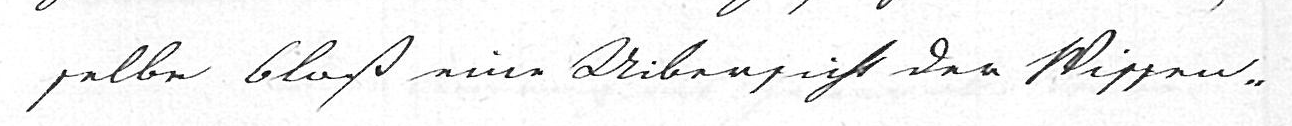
selbe bloß eine Uibersicht der Wissen-
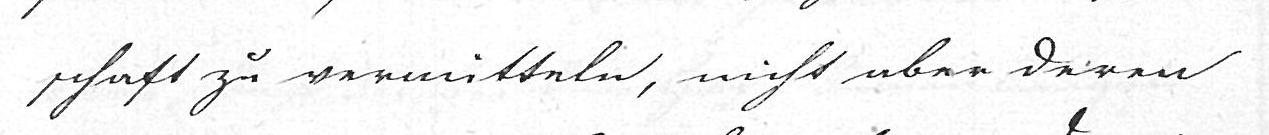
schaft zu vermitteln, nicht über deren
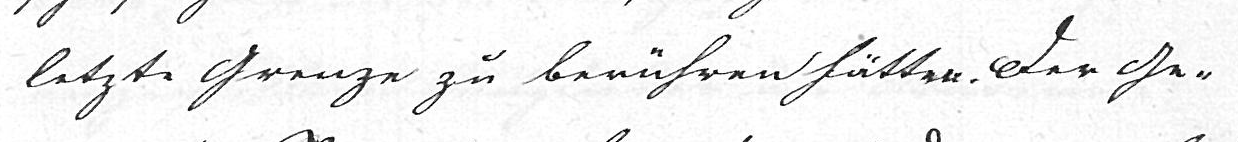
letzten Grenze zu berühren hätten. Der Ge-
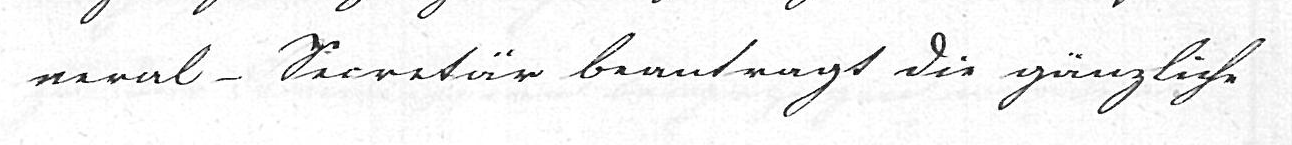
neral-Secretär beantragt die gänzliche
